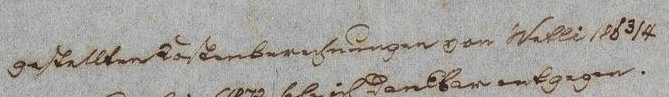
gestellten Kostenberechnungen von Wetli 1863/4
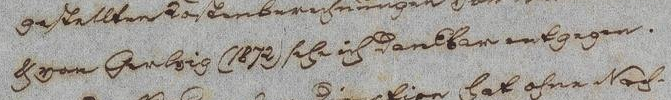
& von Gerwig (1872) sehe ich dankbar entgegen.
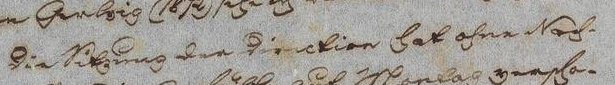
Die Sitzung der Direction hat ohne Nach-
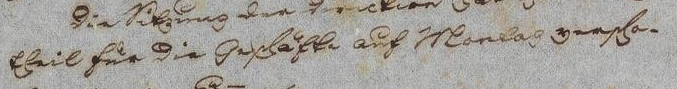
theil für die Geschäfte auf Montag verscho-
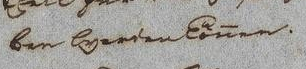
ben werden können.
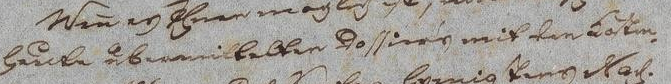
heute übermittelten Dossier's mit den Kosten-
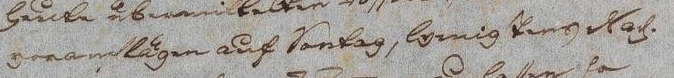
voranschlägen auf Sontag, wenigstens Nach-
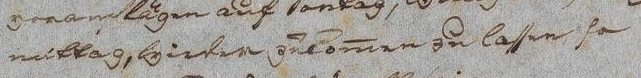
mittag, wieder zukommen zu lassen, so
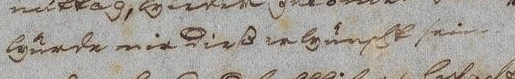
würde mir dieß erwünscht sein.
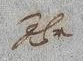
Escher
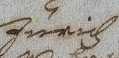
Zürich
